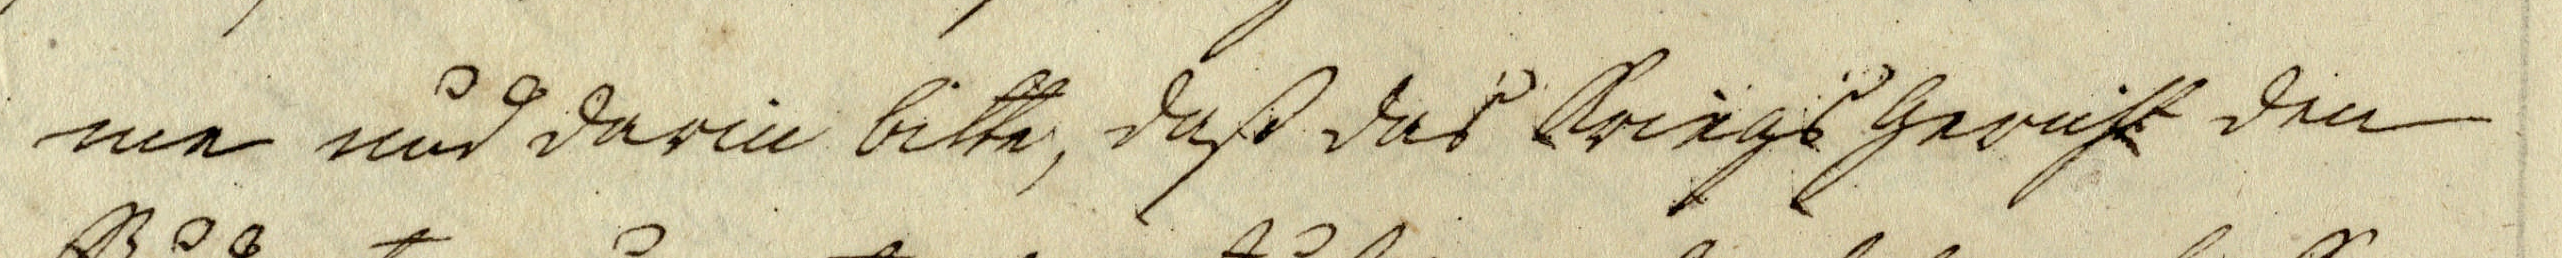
me und darin bitte, daß das Kriegs Gericht den
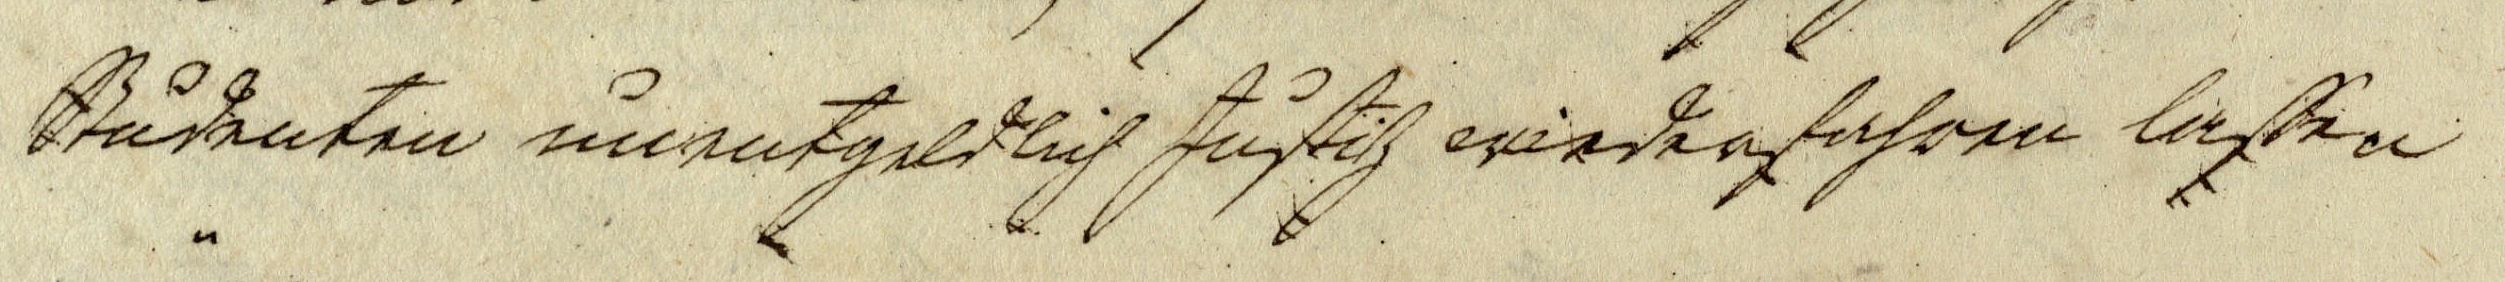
Studenten unentgeldlich Justiz wiederfahren lassen
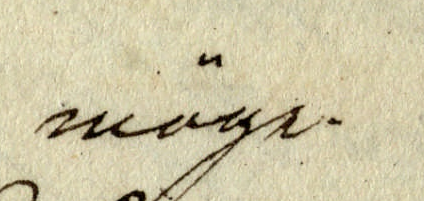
möge.
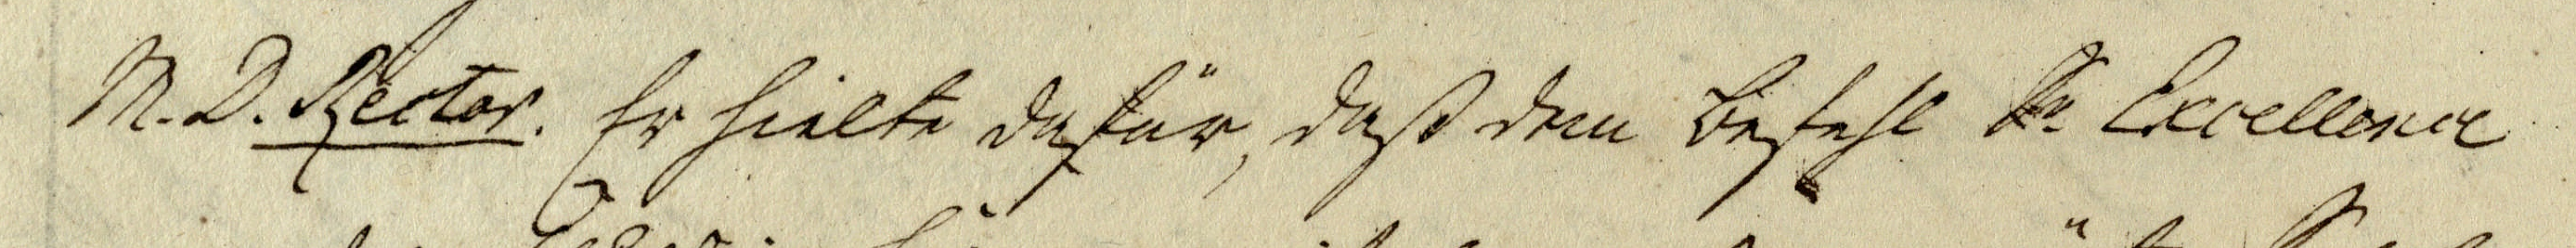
M. D. Rector. Er hielte dafür, daß dem Befehl Sr Excellence
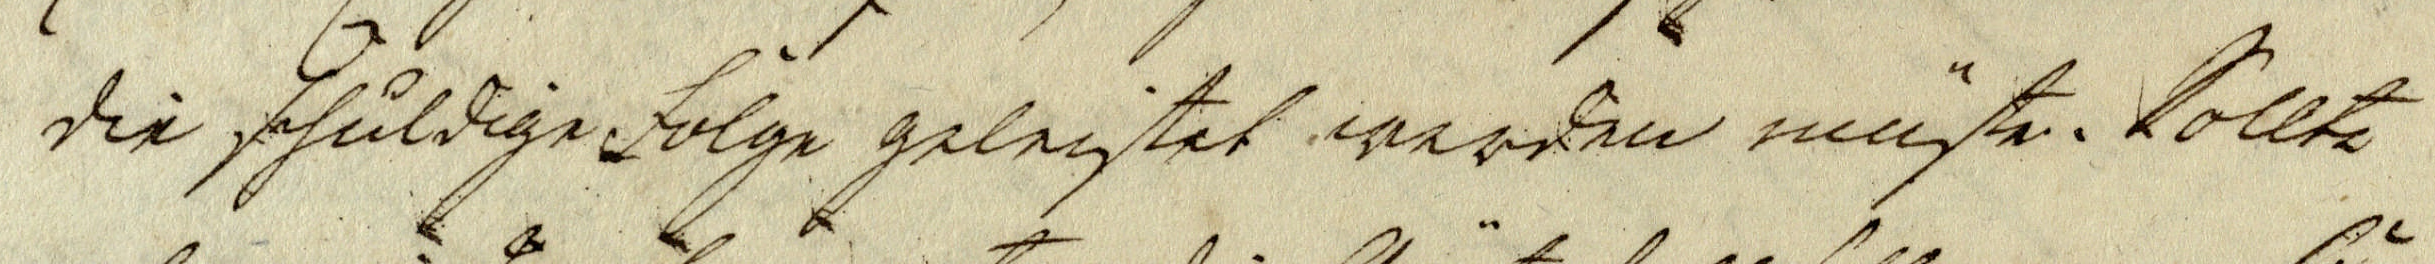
die schuldige Folge geleistet werden müßte. Sollte
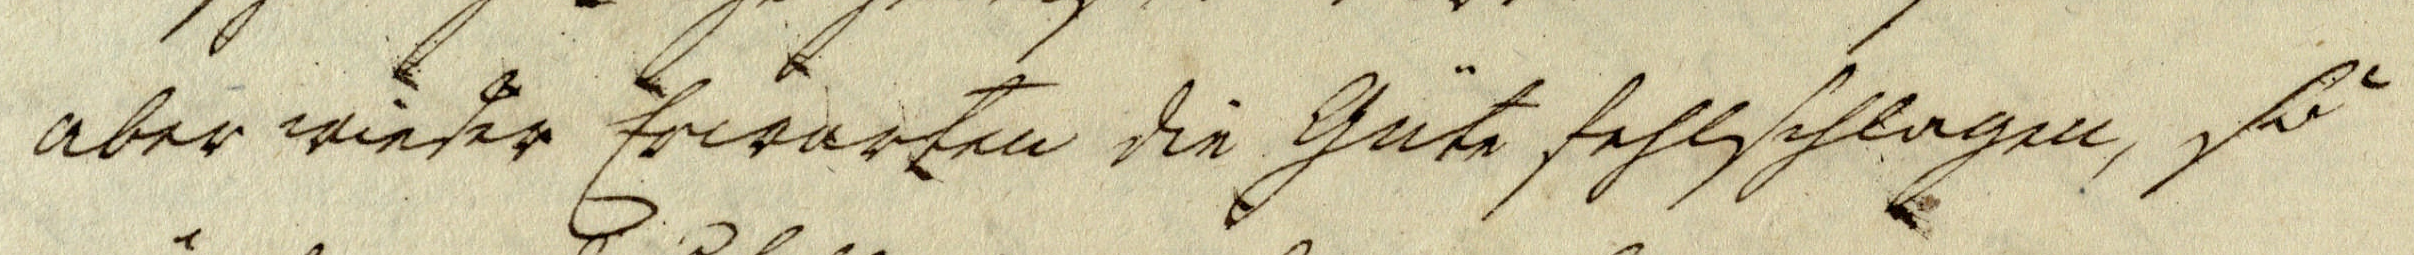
aber wieder Erwarten die Güte fehlschlagen, so
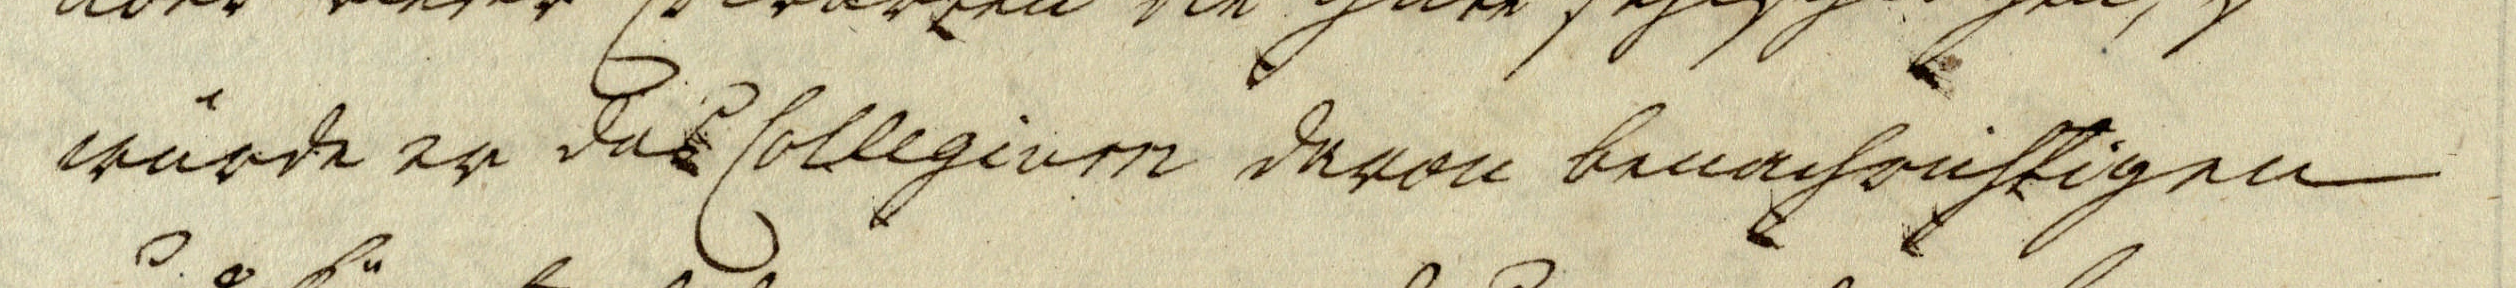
würde er das Collegium davon benachrichtigen
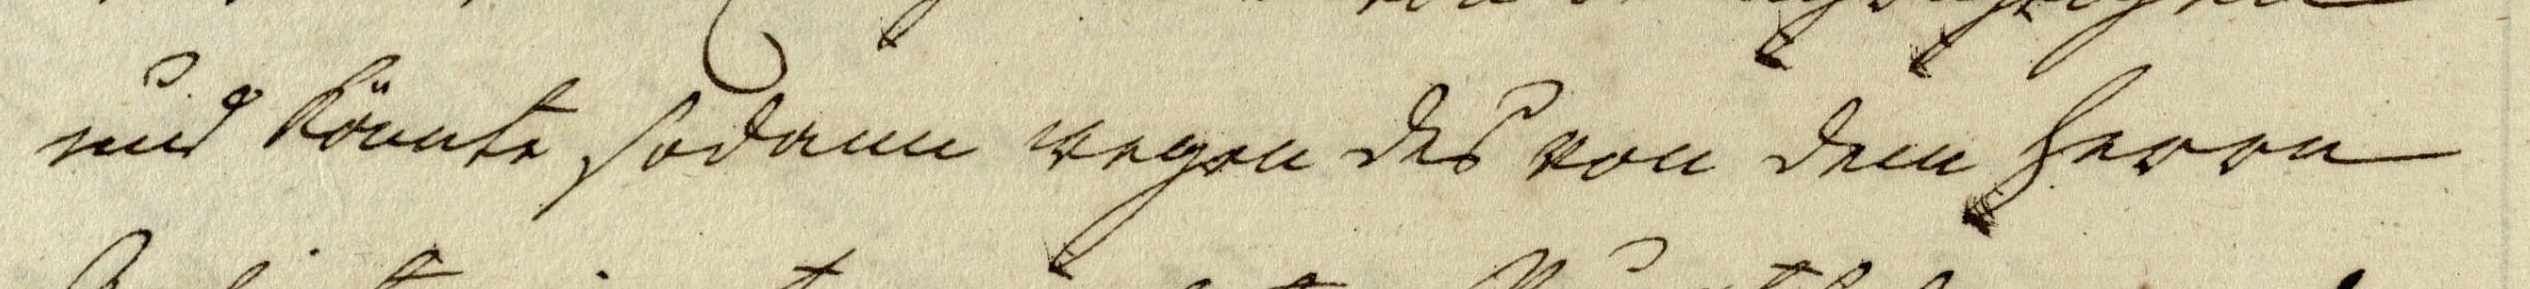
und könnte sodann wegen des von dem Herrn
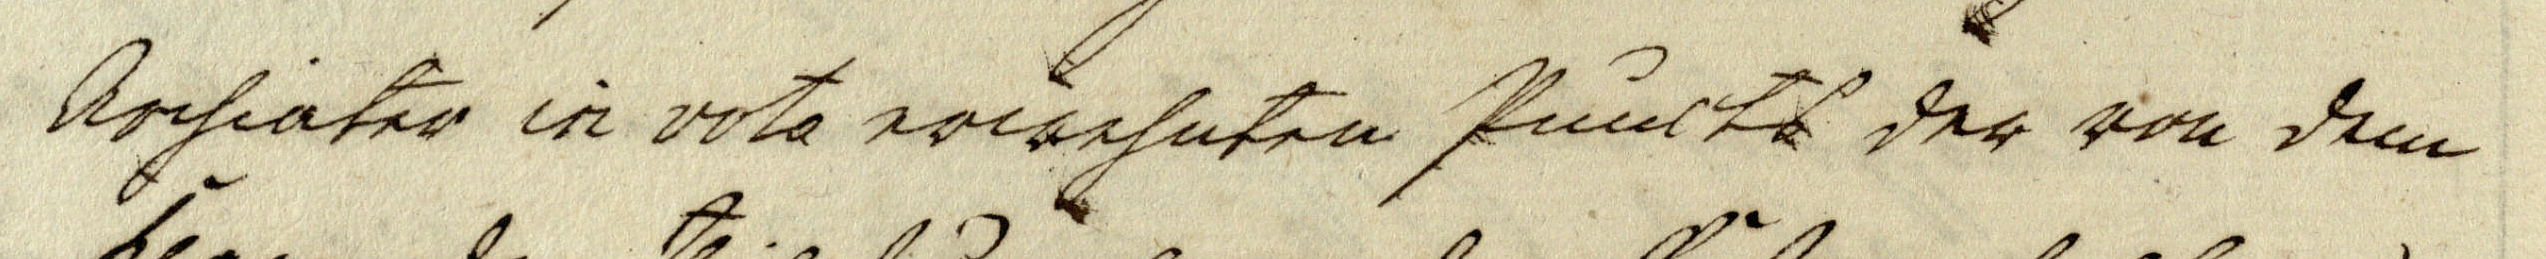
Archiater in voto erwehnten Puncts der von dem
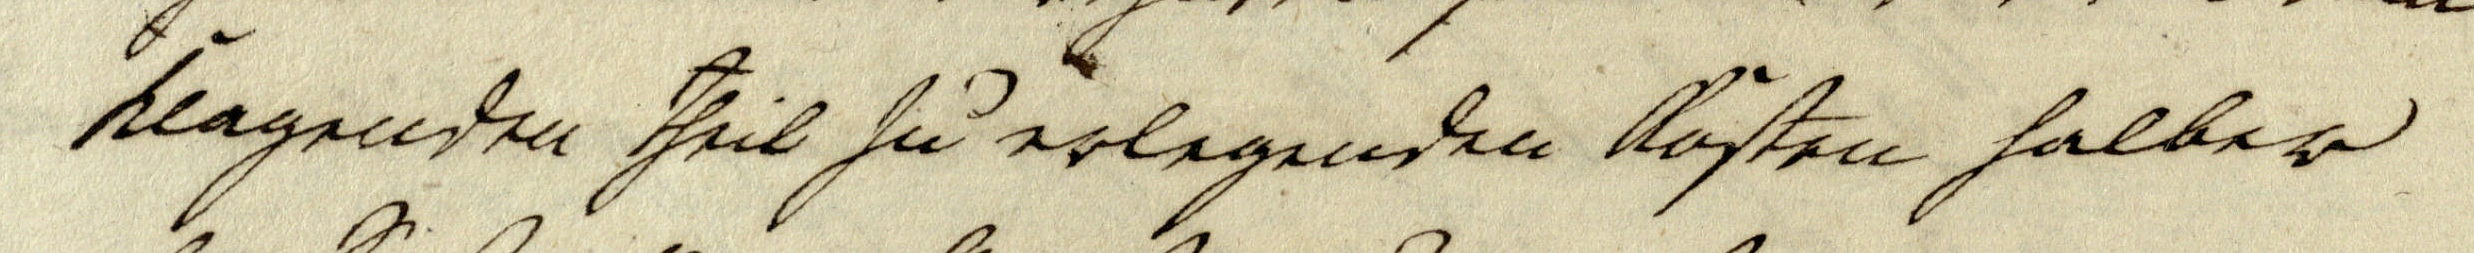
Klagenden Theil zu erlegenden Kosten halber
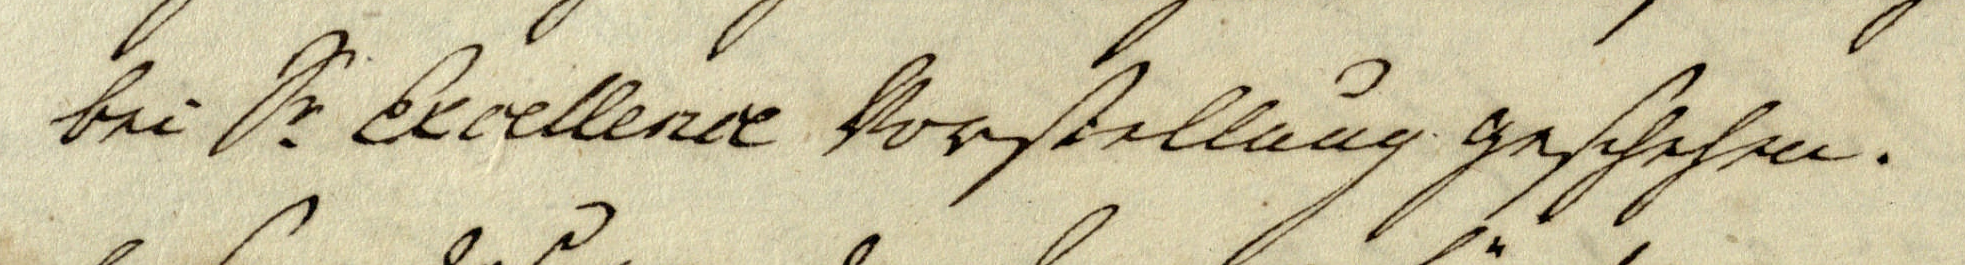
bei Sr Excellence Vorstellung geschehen.
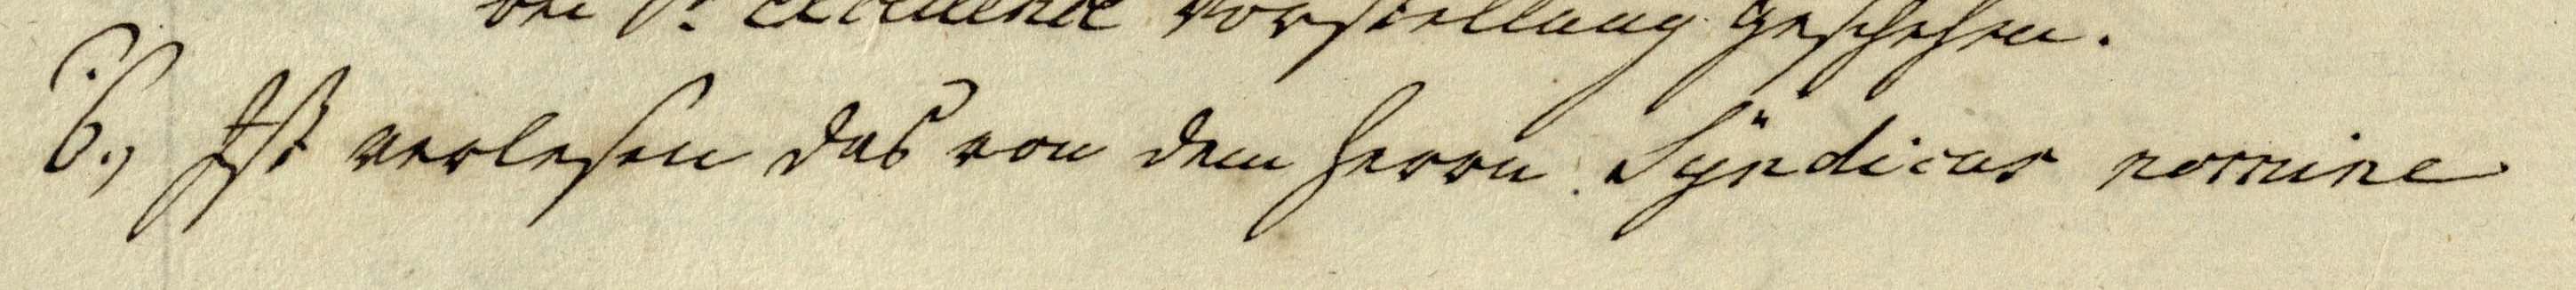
6., Ist verlesen das von dem Herrn Sÿndicus nomine
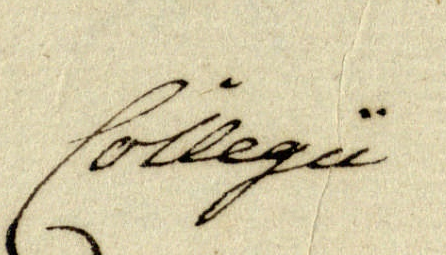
Collegii
